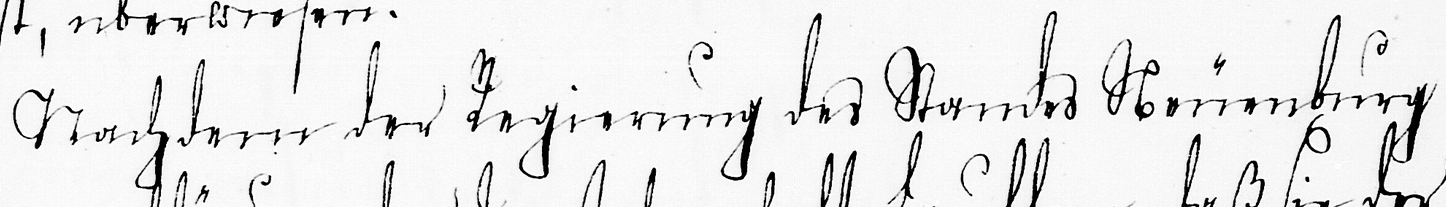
Nachdem der Regierung des Standes Neuenburg
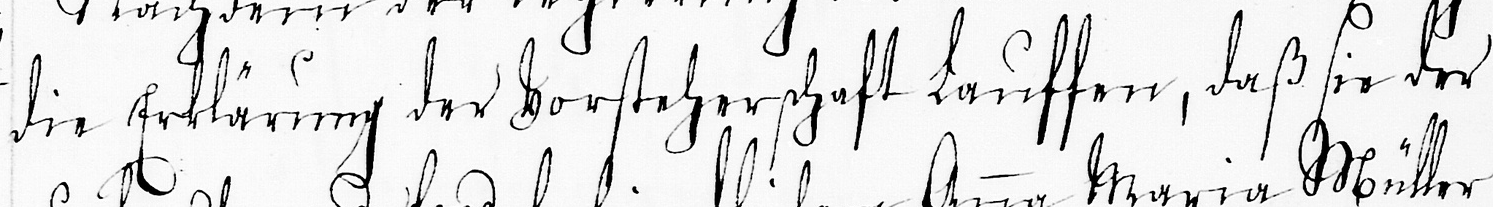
die Erklärung der Vorsteherschaft Lauffen, daß sie der
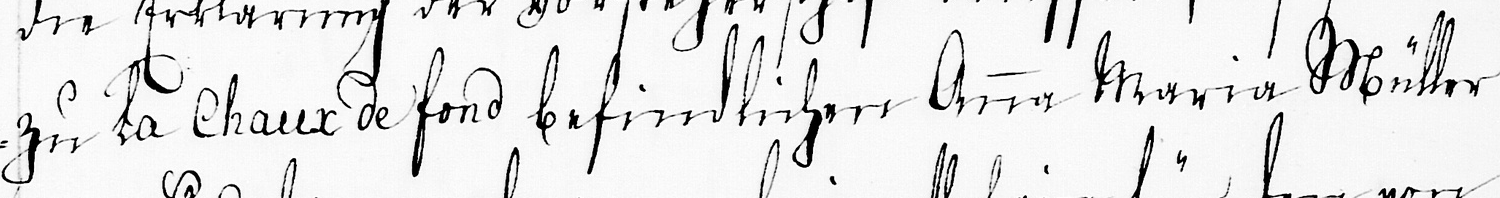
zu La Chaux de fond befindlichen Anna Maria Müller
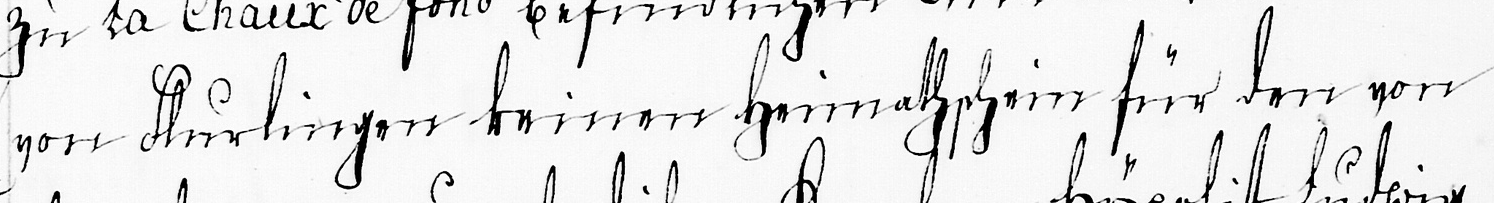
von Flurlingen keinen Heimathschein für den von
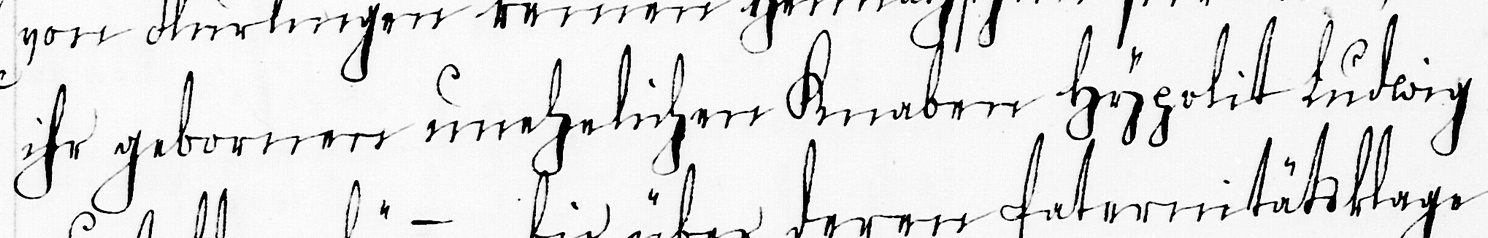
ihr gebornen unehelichen Knaben Hypolit Ludwig
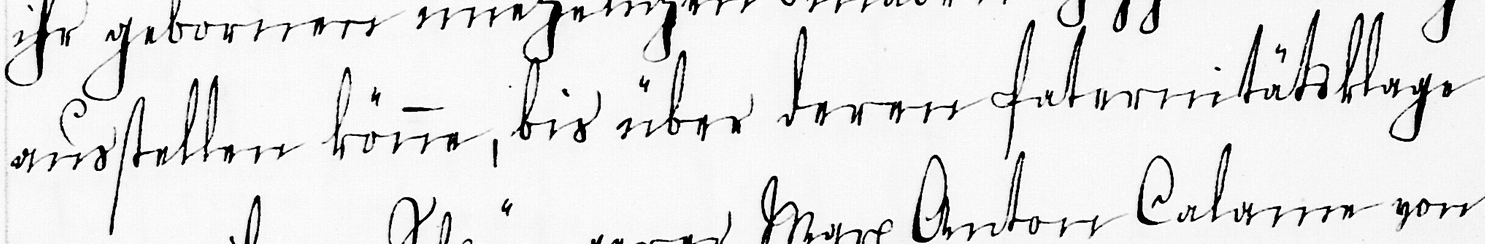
ausstellen könne, bis über deren Paternitätsklage
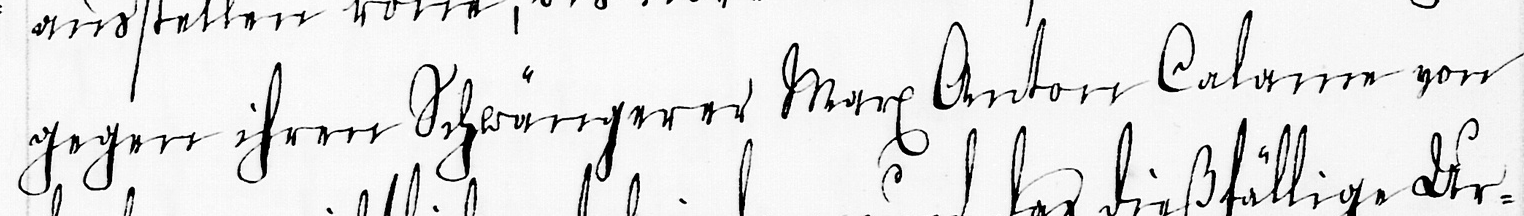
gegen ihren Schwängerer Marx Anton Calame von
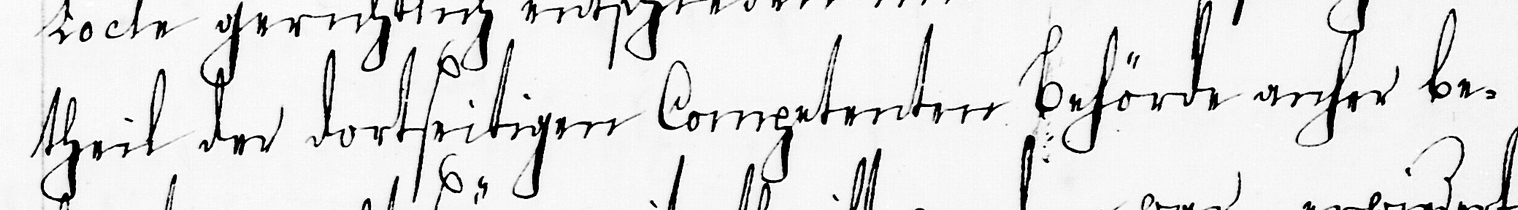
theil der dortseitigen Competenten Behörde anher be¬
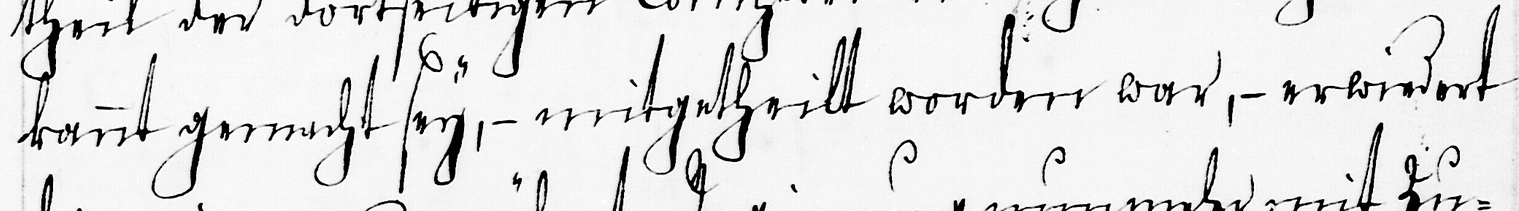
kannt gemacht sey, – mitgetheilt worden war, – erwiedert
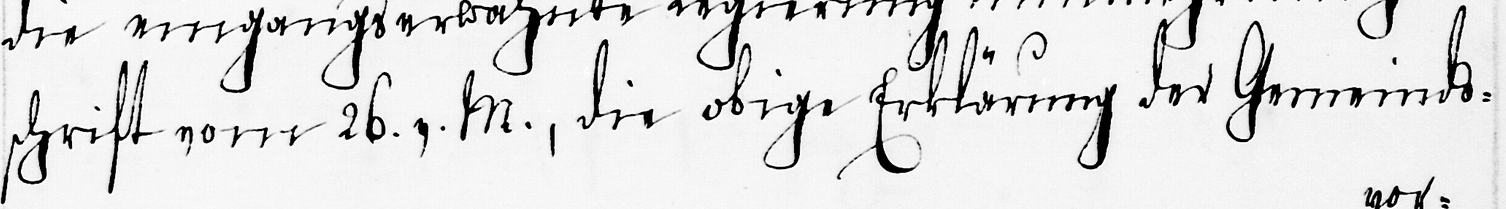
chrift vom 26. v. M., die obige Erklärung der Gemeinds-
